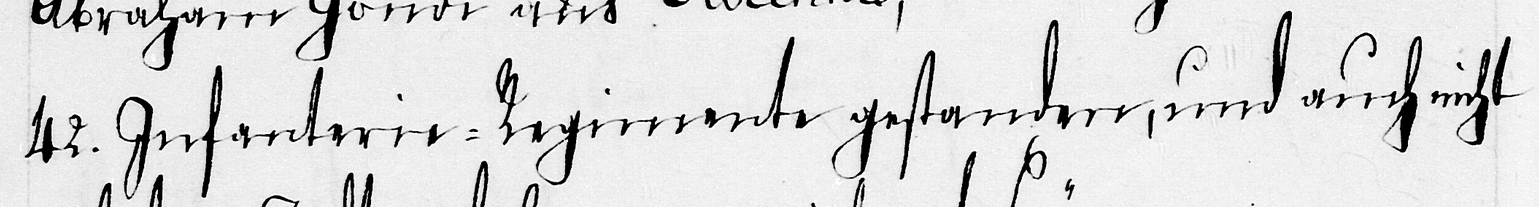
42. Infanterie-Regimente gestanden, und auch nicht
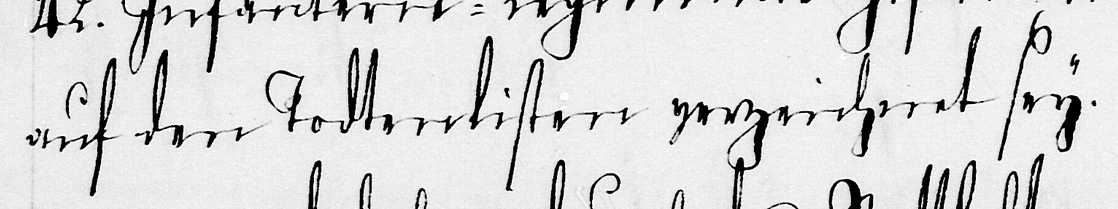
auf den Todtenlisten verzeichnet sey.
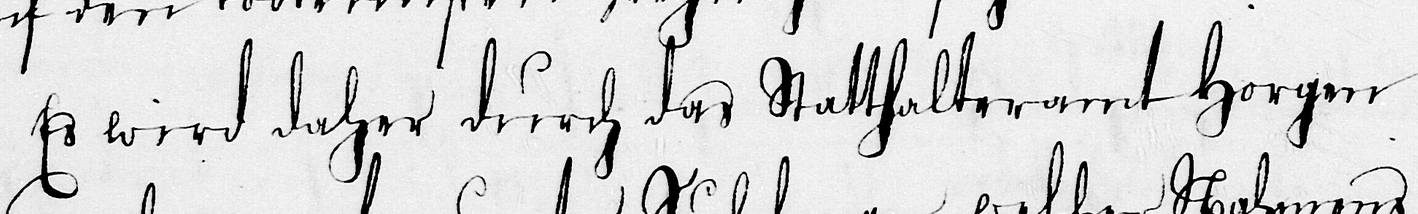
Es wird daher durch das Statthalteramt Horgen
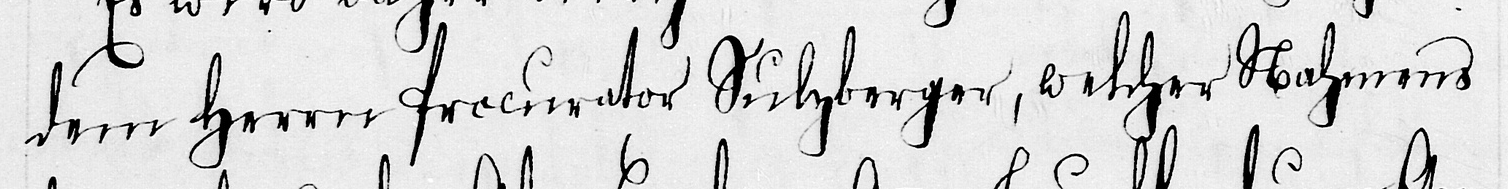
dem Herrn Procurator Sulzberger, welcher Nahmens
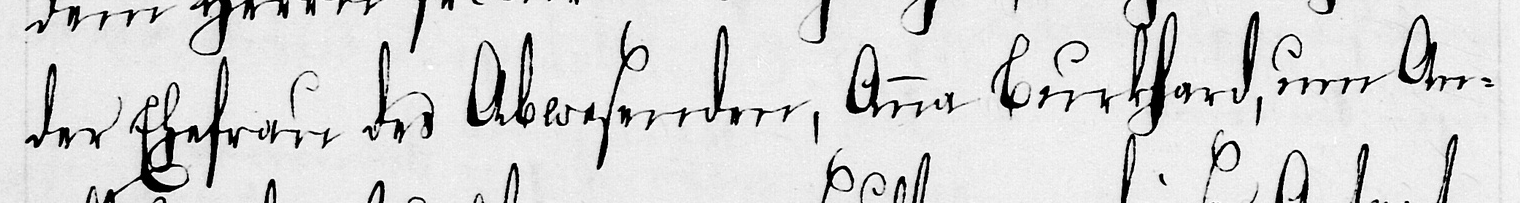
der Ehefrau des Abwesenden, Anna Burkhard, um An¬
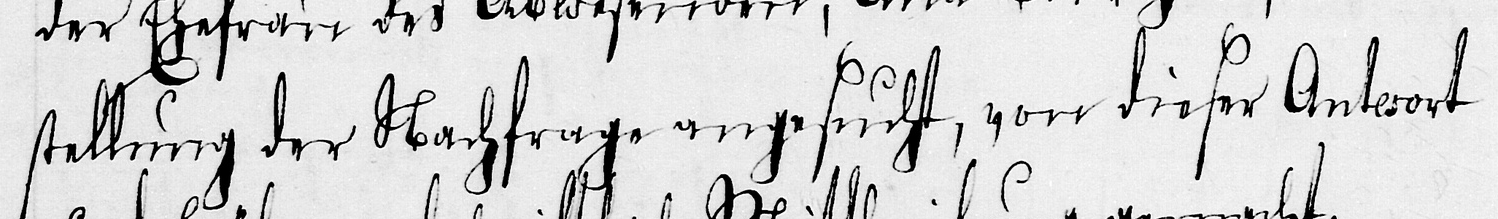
stellung der Nachfrage angesucht, von dieser Antwort
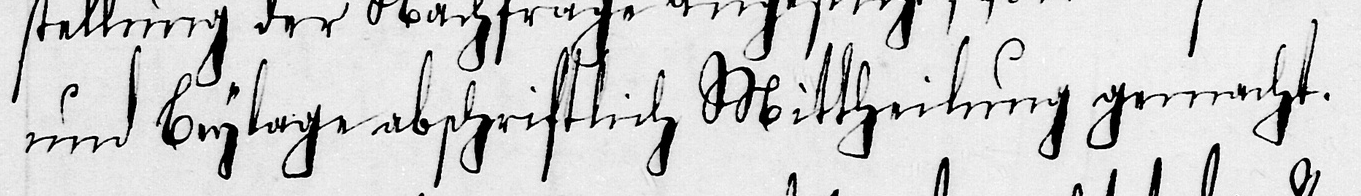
und Beylage abschriftlich Mittheilung gemacht.
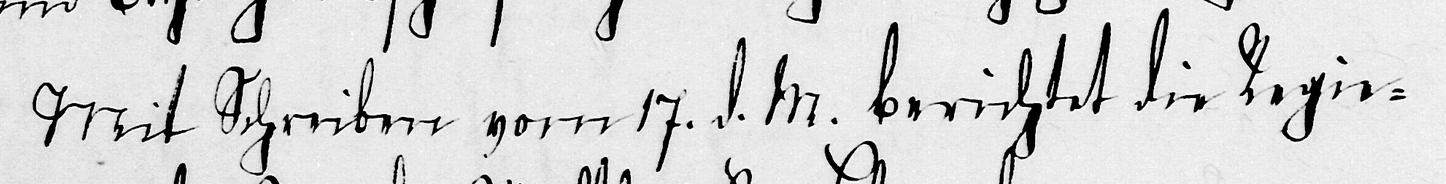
Mit Schreiben vom 17. d. M. berichtet die Regie¬
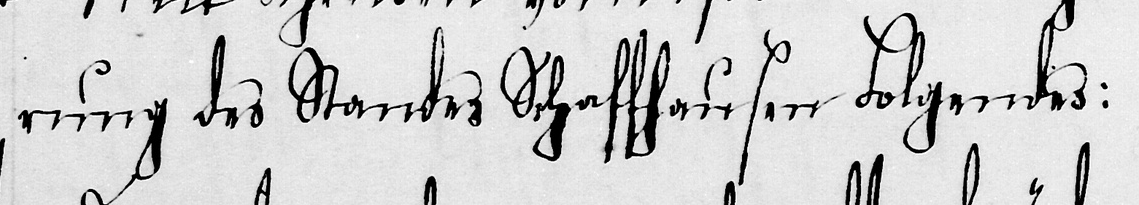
rung des Standes Schaffhausen Folgendes:
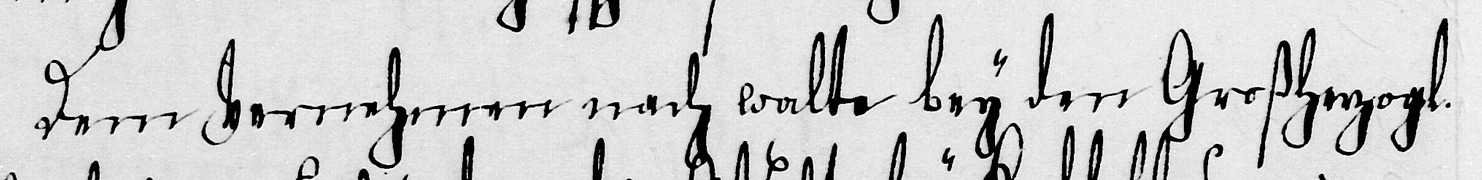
Dem Vernehmen nach walte bey den Großherzogl.
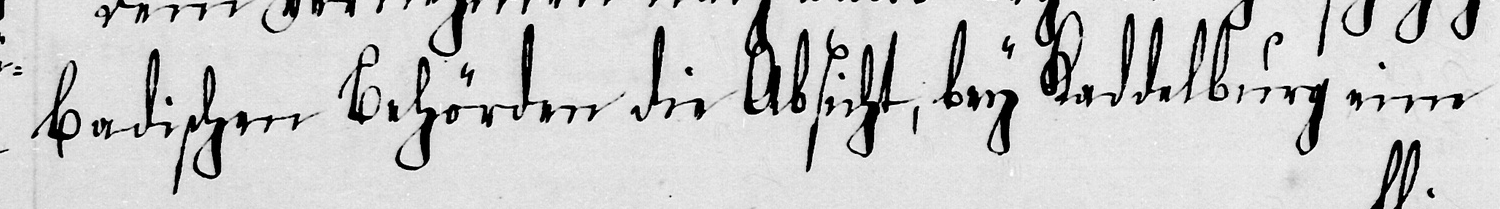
Badischen Behörden die Absicht, bey Kaddelburg eine
